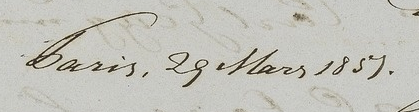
Paris, 29 Mars 1857.
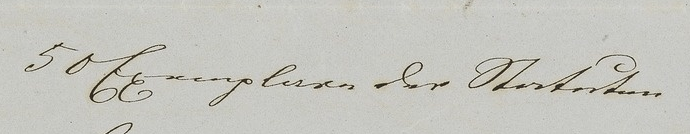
50 Exemplare der Statuten
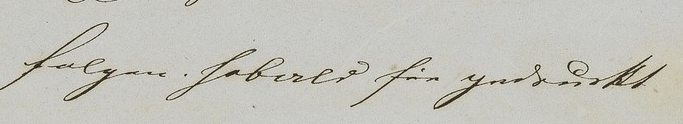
folgen sobald sie gedruckt
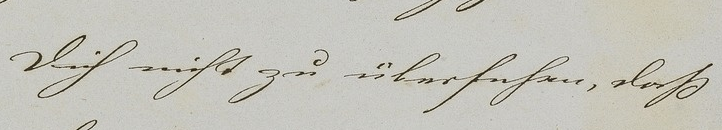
Dich nicht zu übersehen, daß
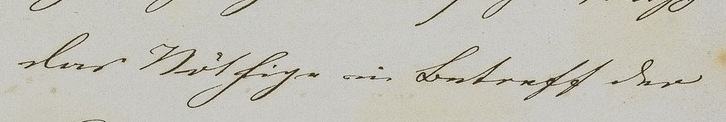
das Nöthige in Betreff der
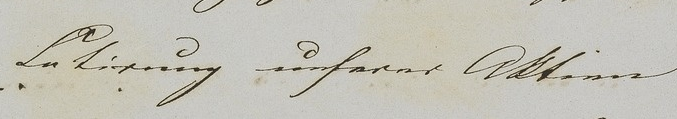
Cotirung unserer Aktien
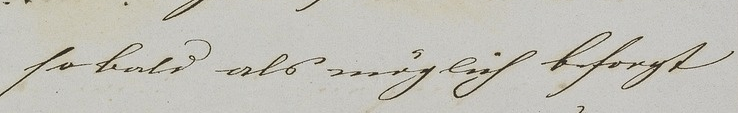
sobald als möglich besorgt
